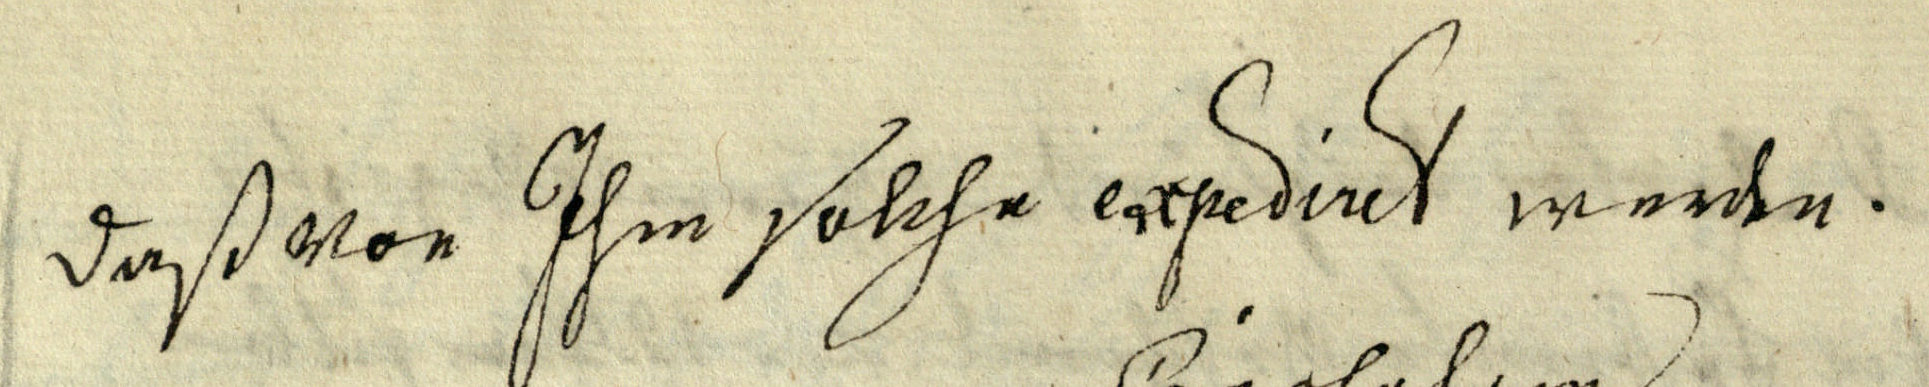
daß von Ihm solche expediret werden.
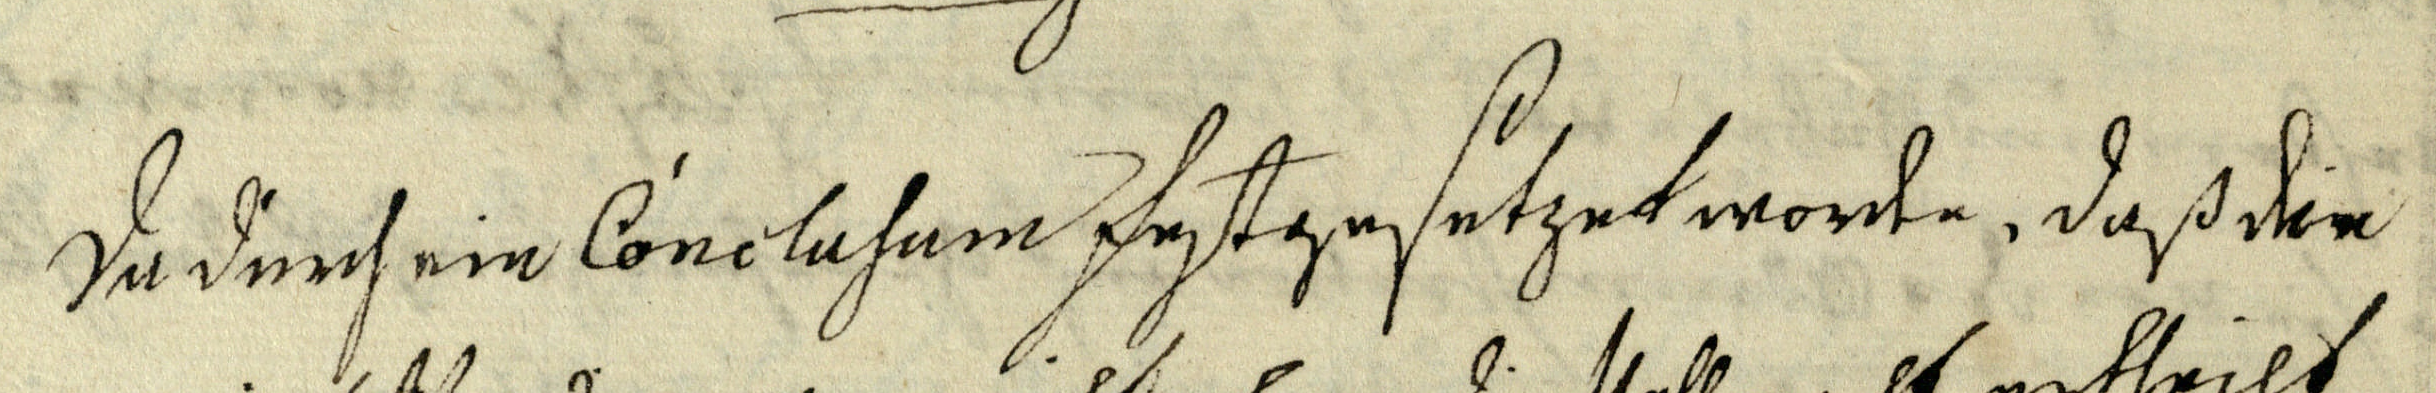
da das Conlusum festgesetzet worden, daß den
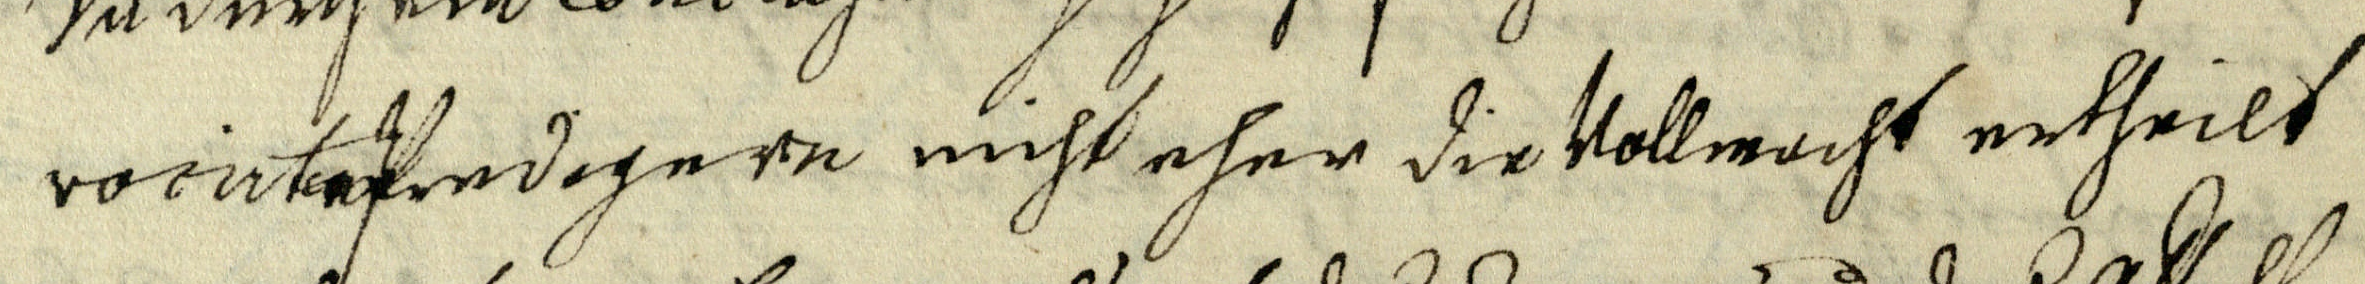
votirten Predigern nicht eher die Vollmacht ertheilt
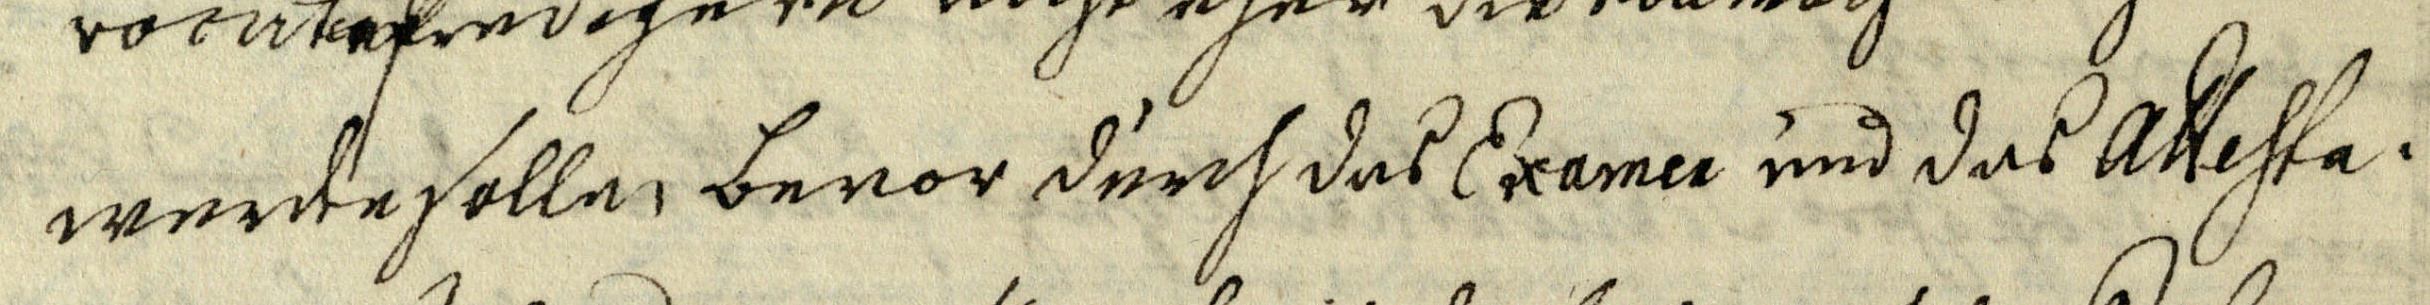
werden solle, bevor durch das Examen und das Attesta¬
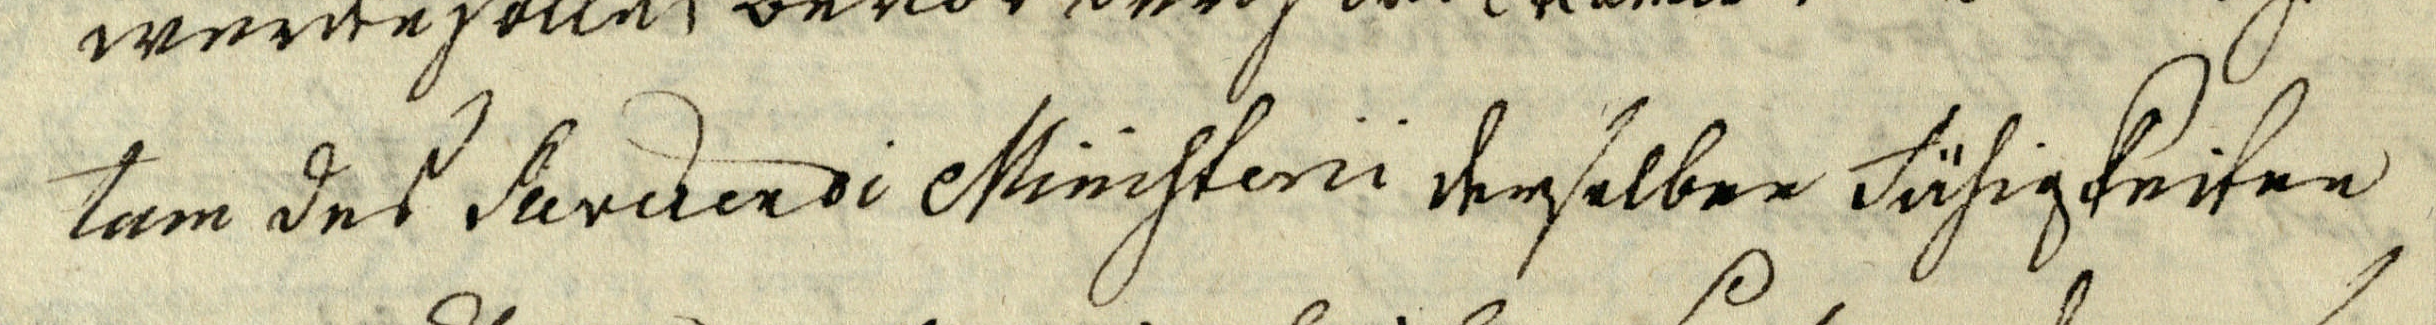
tum des Servendi Ministerii derselben Fähigkeiten
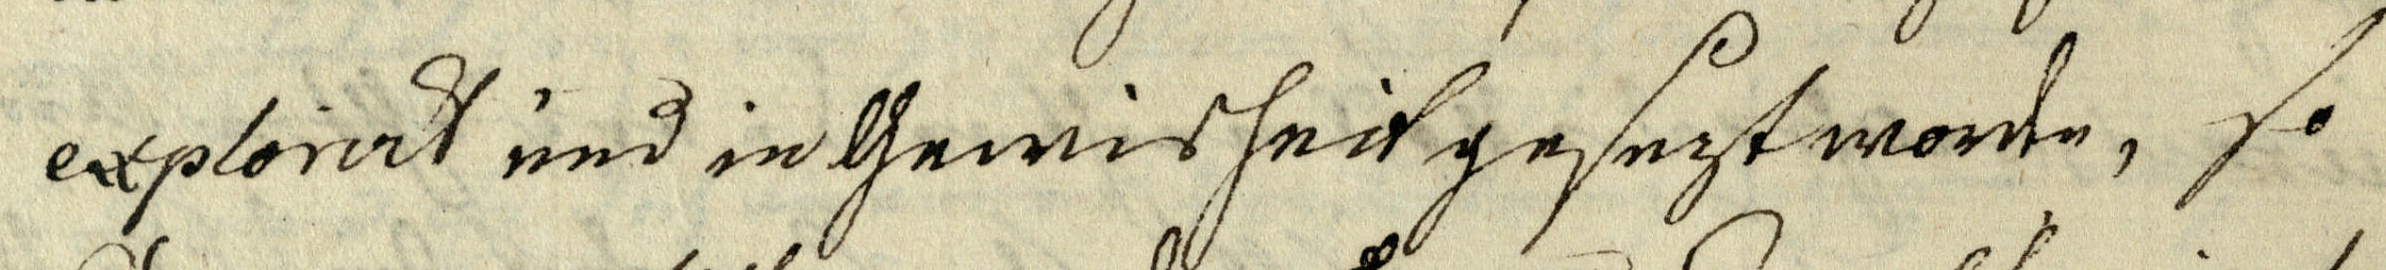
explirirt und in Gewisheit gesezt worden, so
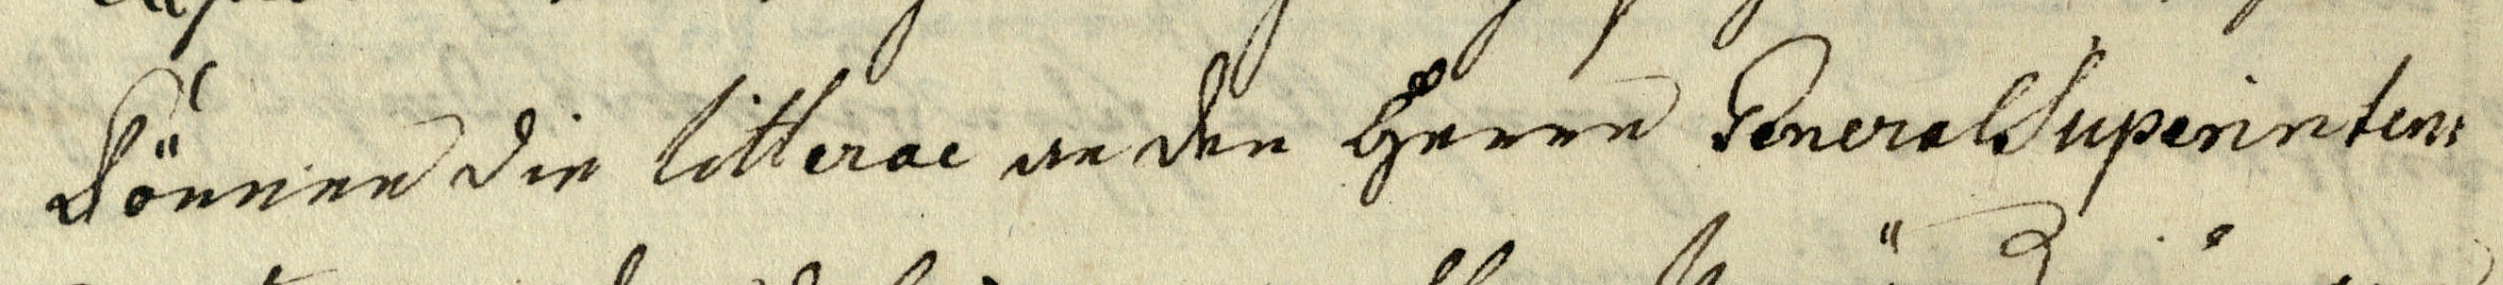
können die litterae an den herrn General Superinten¬
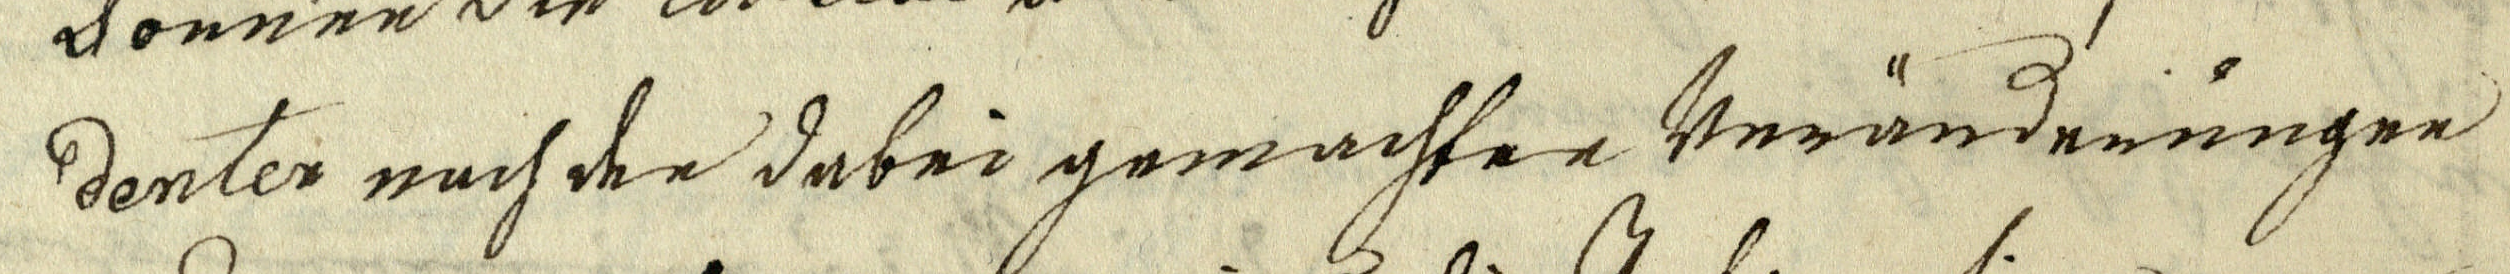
denten nach den dabei gemachten Veränderungen
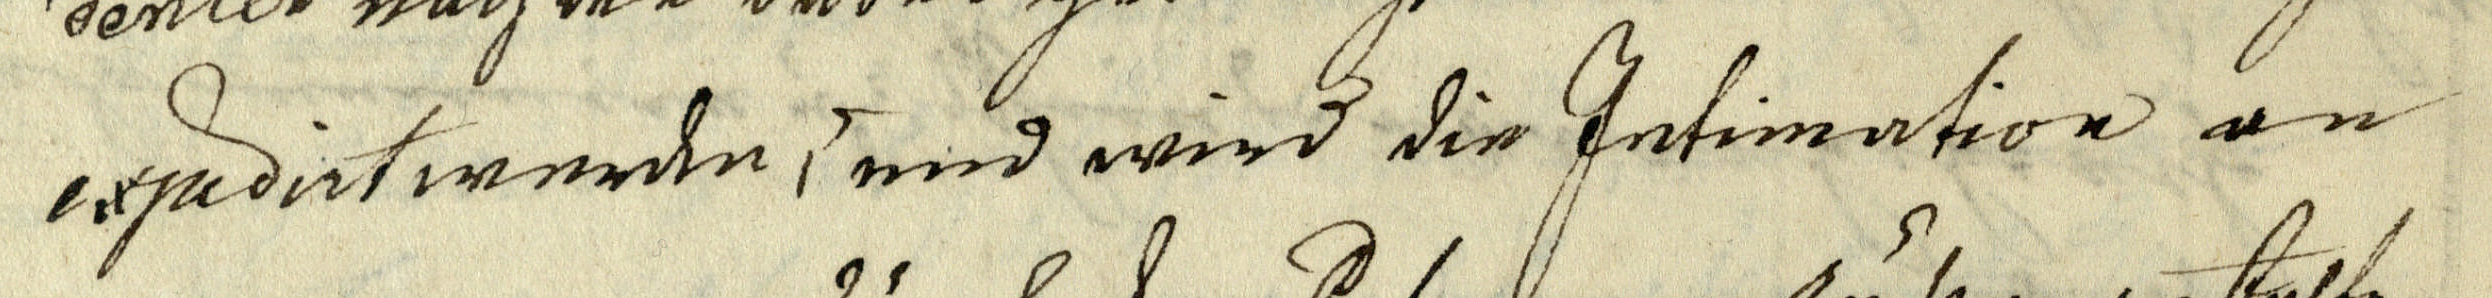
expedirt werden, und wird die Intimation an
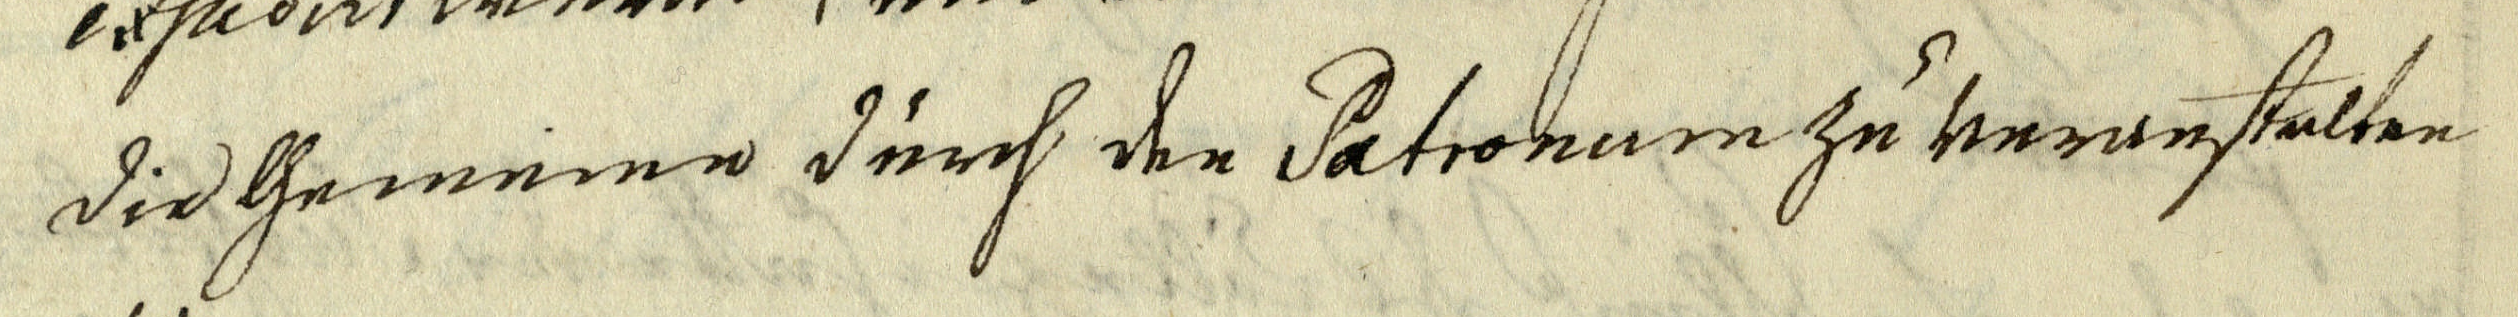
die Gemeine durch den Patronum zu veranstalten
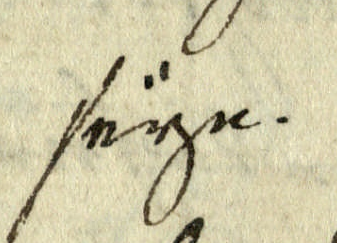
seÿn.
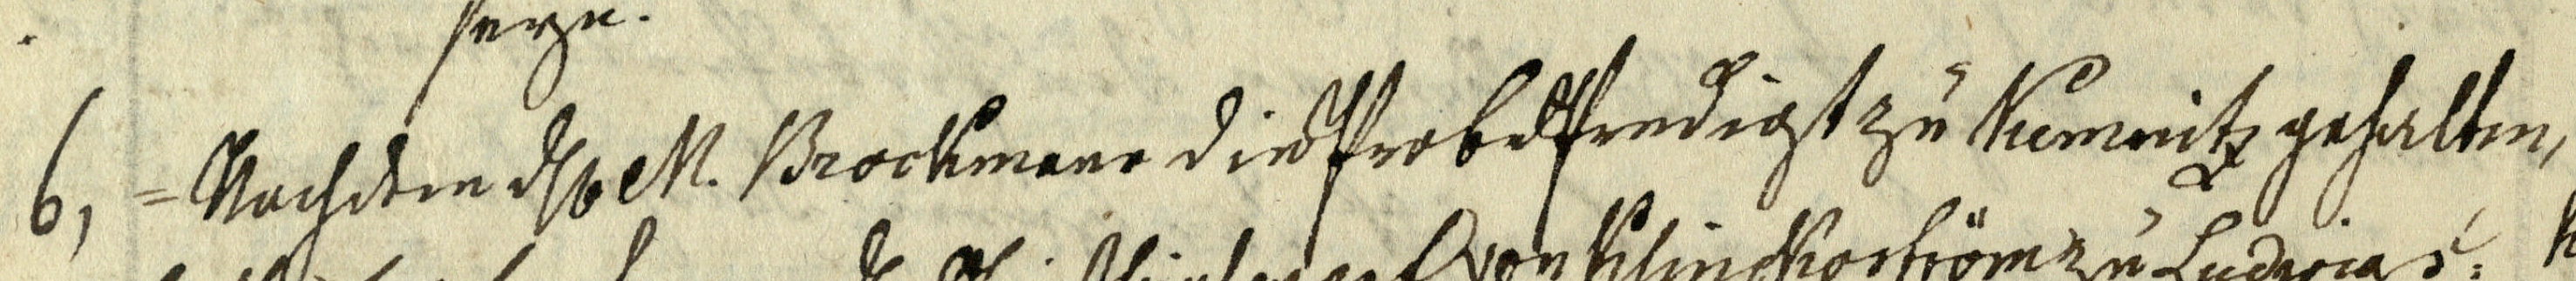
6, = Nachdem dH M. Brockmann die Prebe Predigt zu Kemnitz gehalten,
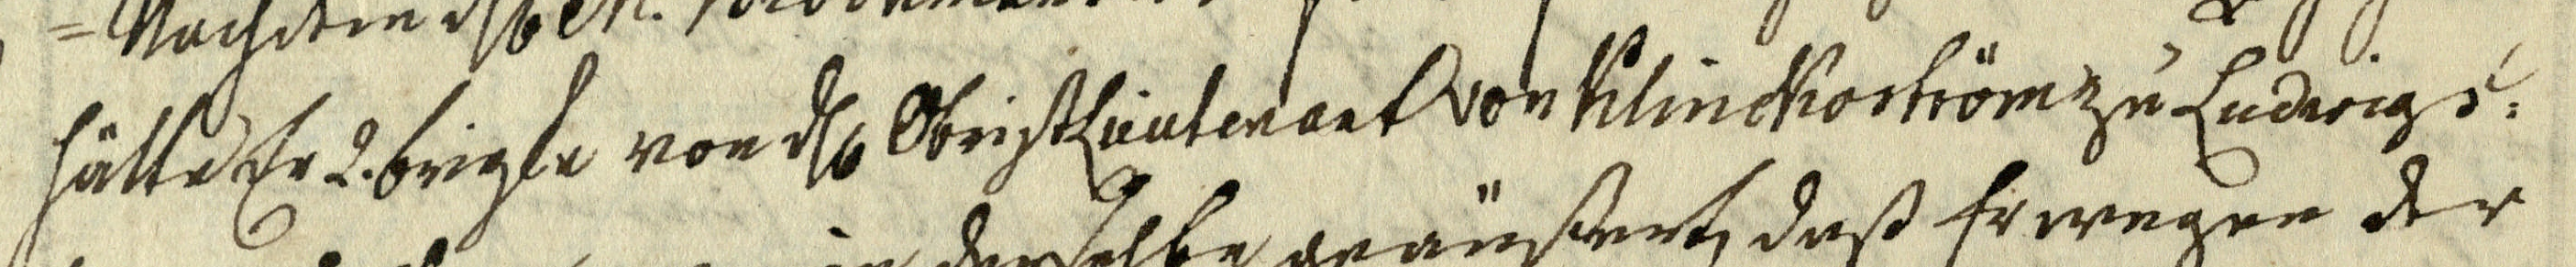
Hätte Er 2. briefe von dH Obristlieutenant von Klinckoström zu Ludwigs¬
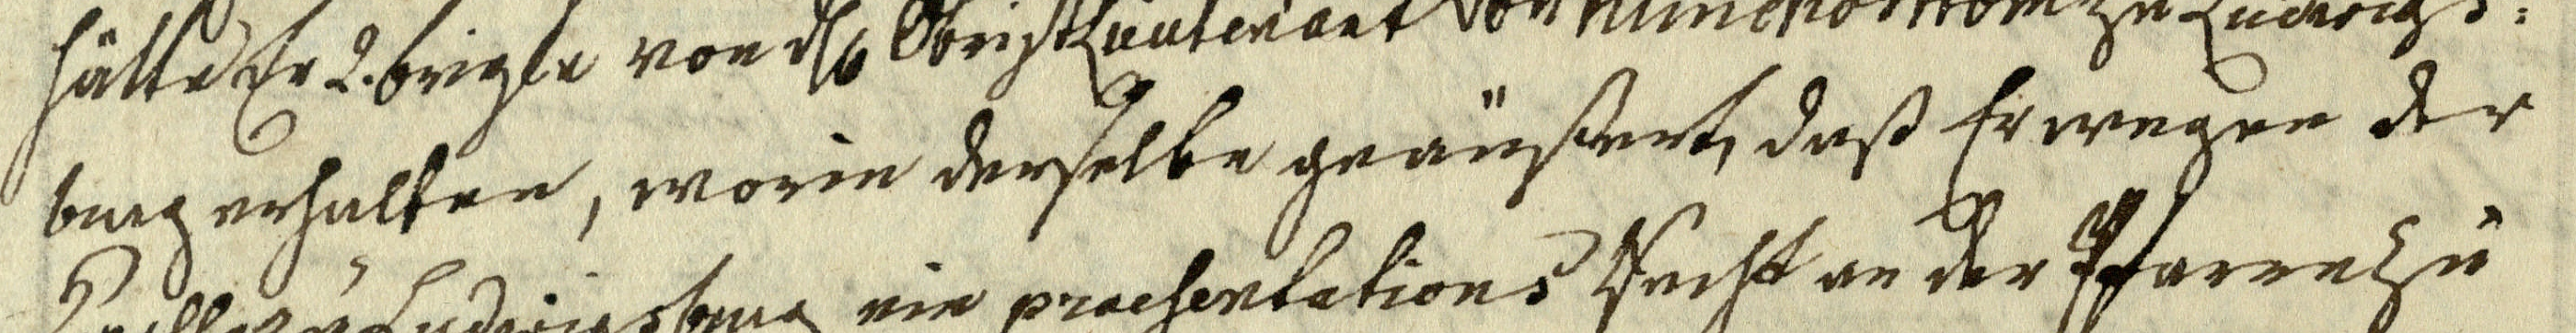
burg erhalten, worin derselbe geäußert, daß Er wegen der
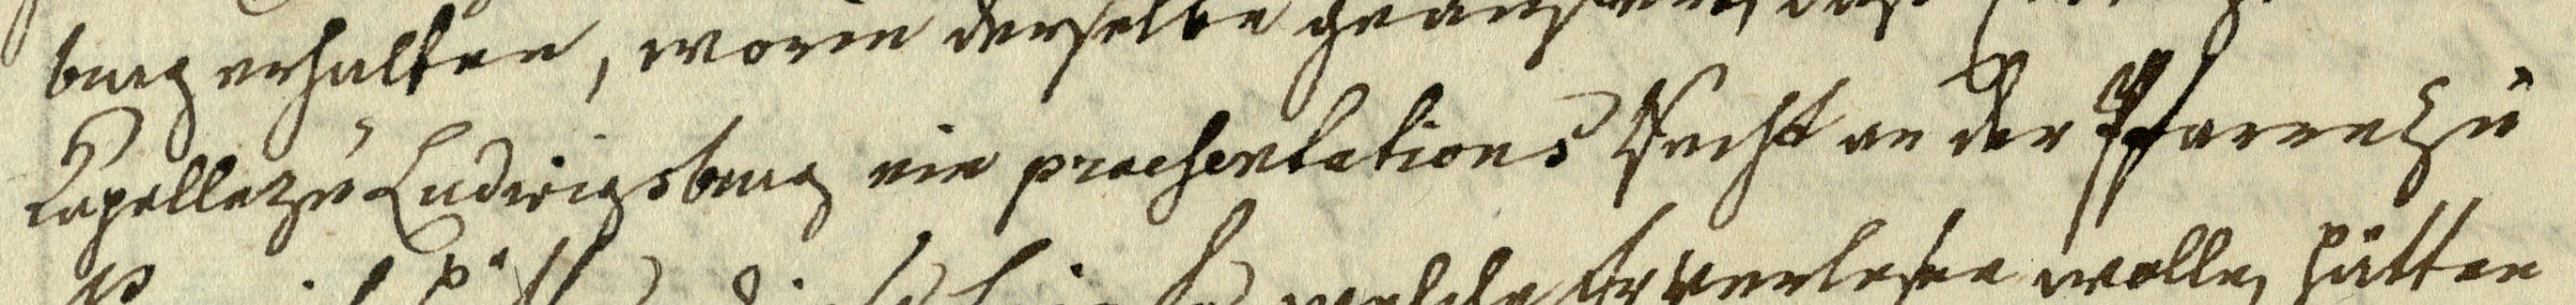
Kapelle zu Ludwigsburg ein praesentations Recht an der Pfarre zu
